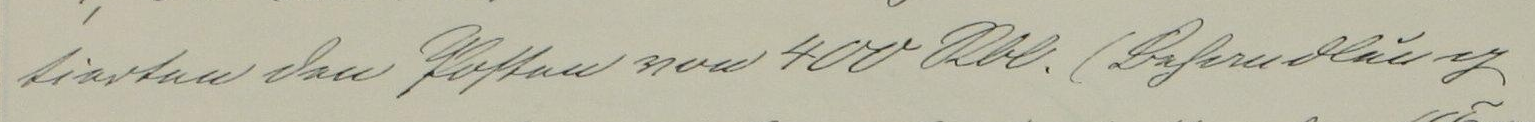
tierten, den Posten von 400 Rbl. (Behandlung
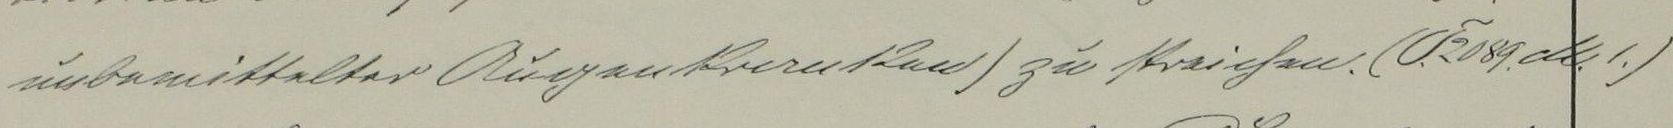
unbemittelter Augenkranken) zu streichen. (T.2089; M.1).
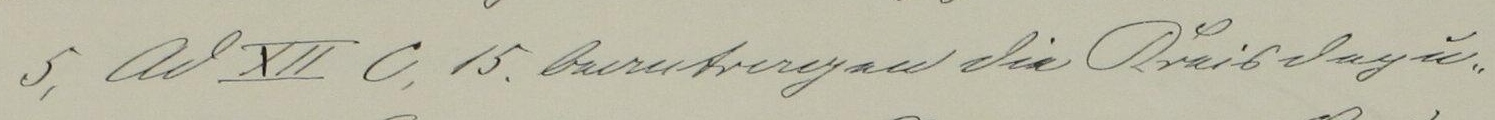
5. Ad XII C, 15. beantragen die Kreisdepu-
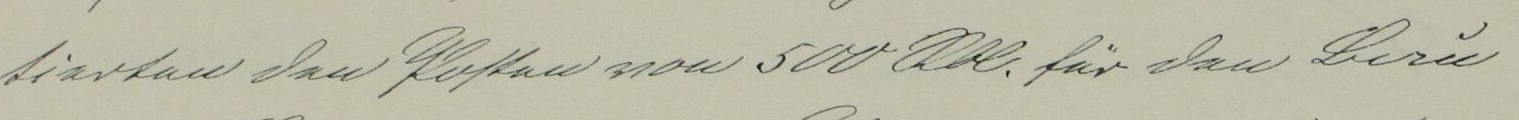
tierten, den Posten von 500 Rbl. für den Bau
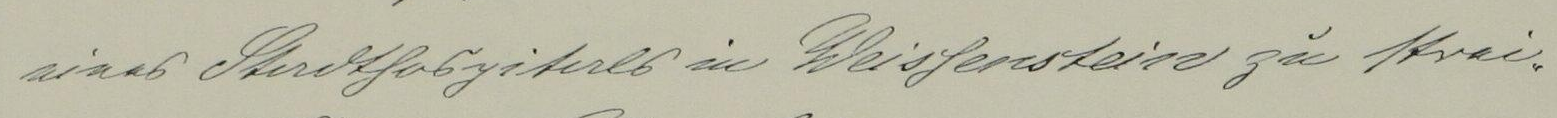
eines Stadthospitals in Weissenstein zu strei-
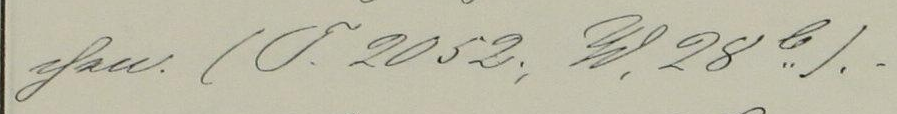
chen. (T.2052; W.28b).
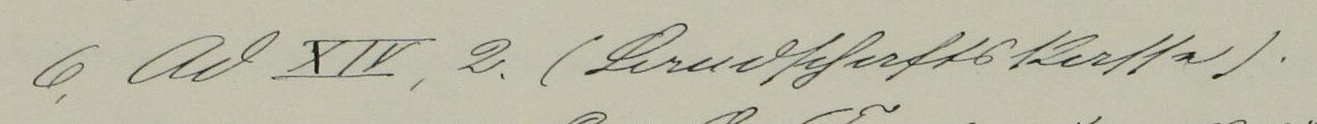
6. Ad XIV, 2. (Landschaftskasse).
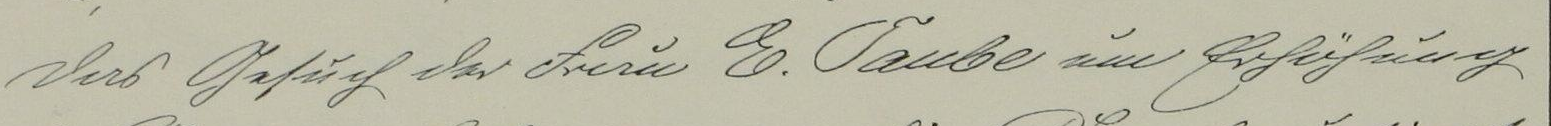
Das Gesuch der Frau E. Taube um Erhöhung
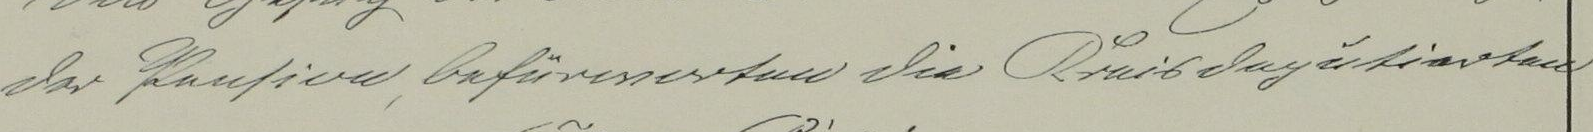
der Pension, befürworten die Kreisdeputierten
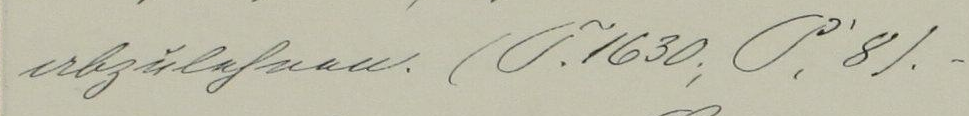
abzulehnen. (T.1630; P.8).
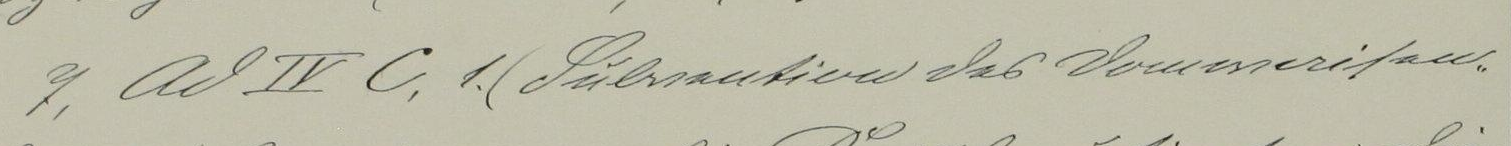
7. Ad IV C, 1. (Subvention des Domwaisen-
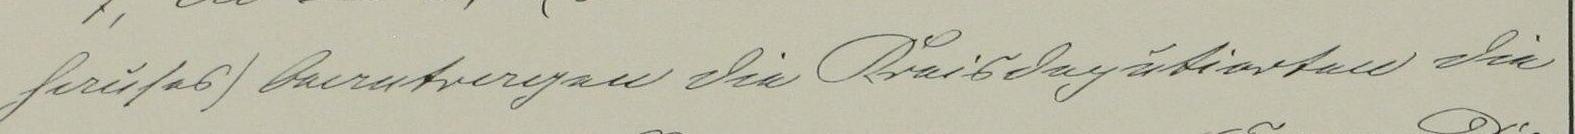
hauses) beantragen die Kreisdeputierten die
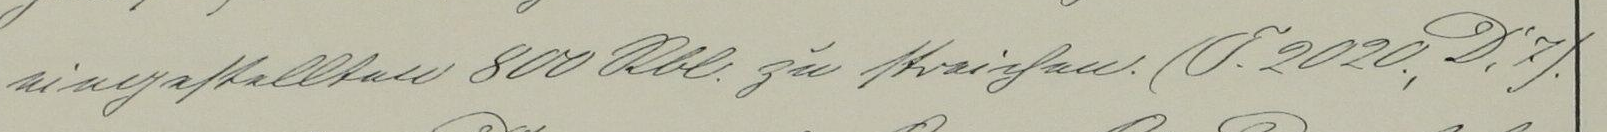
eingestellten 800 Rbl. zu streichen. (T.2020; D.7).
